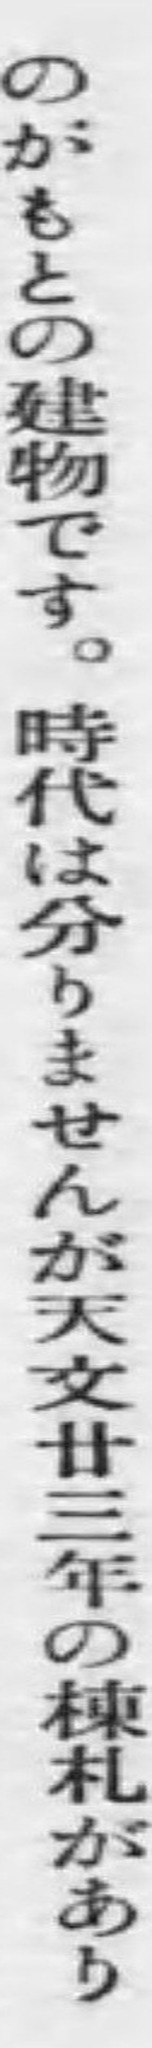のがもとの建物です。時代は分りませんが天文廿三年の棟札があり
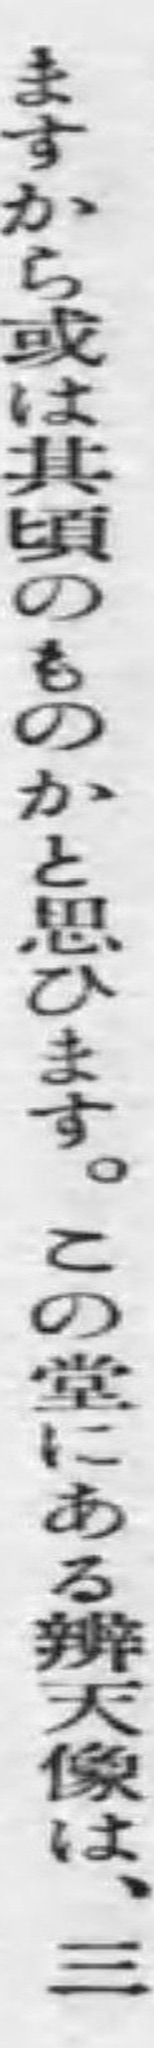ますから或は其頃のものかと思ひます。この堂にある辨天像は、三
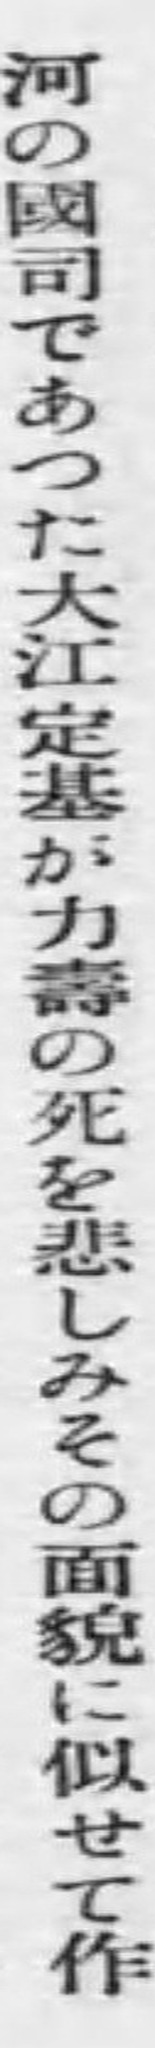河の國司であつた大江定基が力壽の死を悲しみその面貌に似せて作
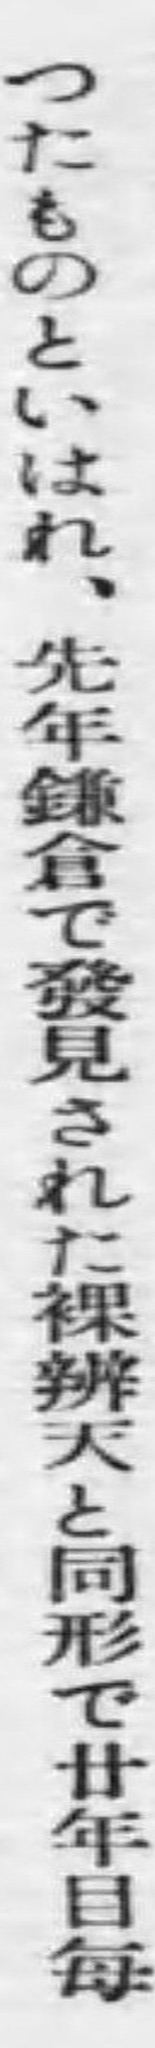つたものといはれ、先年鎌倉で發見された裸辨天と同形で廿年目每
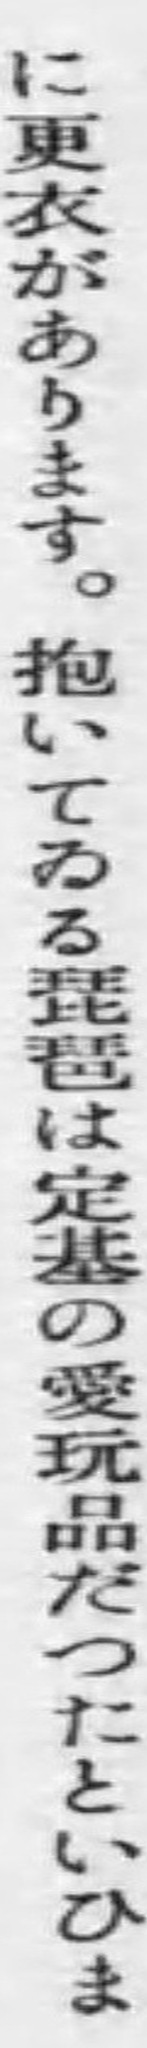に更衣があります。抱いてゐる琵琶は定基の愛玩品だつたといひま
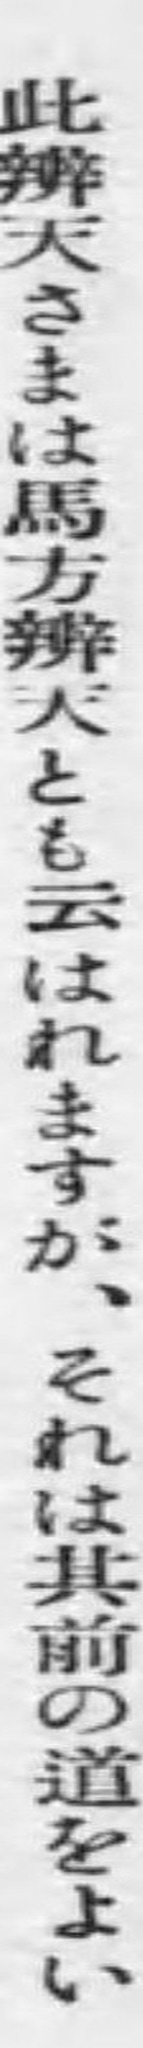此辨天さまは馬方辨天とも云はれますが、それは其前の道をよい
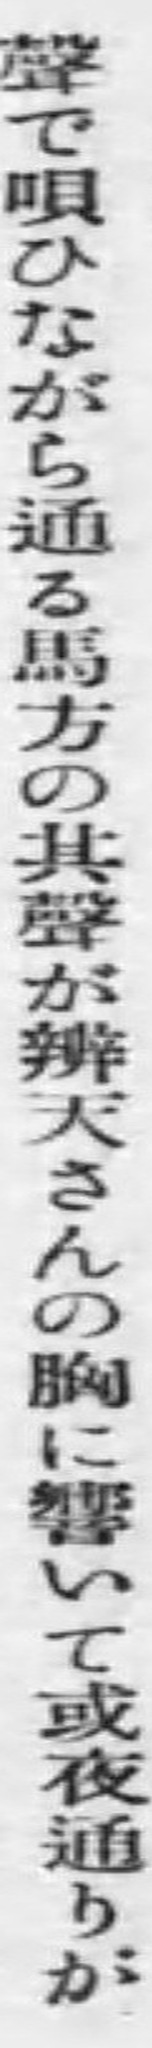聲で唄ひながら通る馬方の其聲が辨天さんの胸に響いて或夜通りが
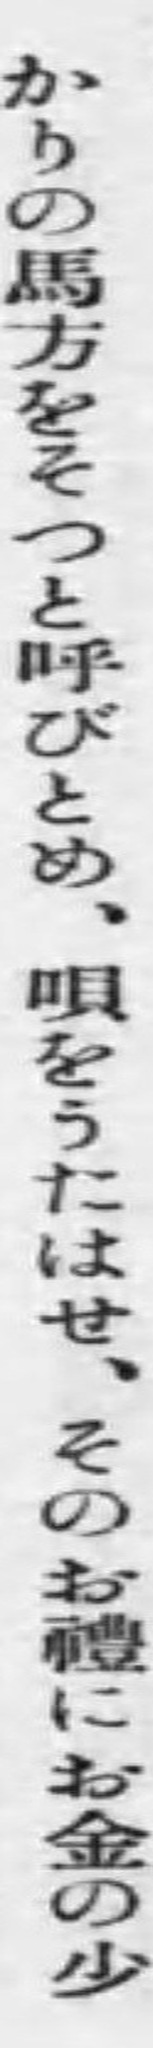かりの馬方をそつと呼びとめ、唄をうたはせ、そのお禮にお金の少
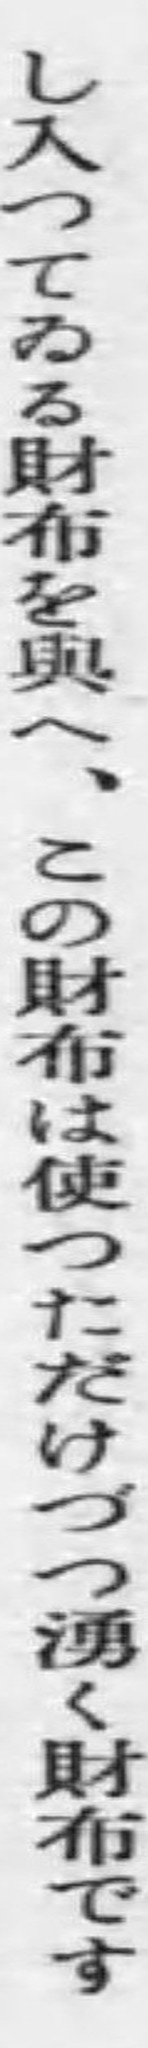し入つてゐる財布を與へ、この財布は使つただけづつ湧く財布です
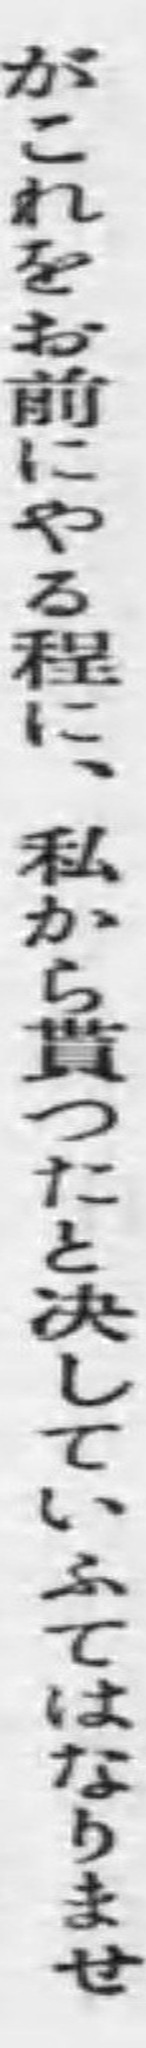がこれをお前にやる程に、私から貰つたと決していふてはなりませ
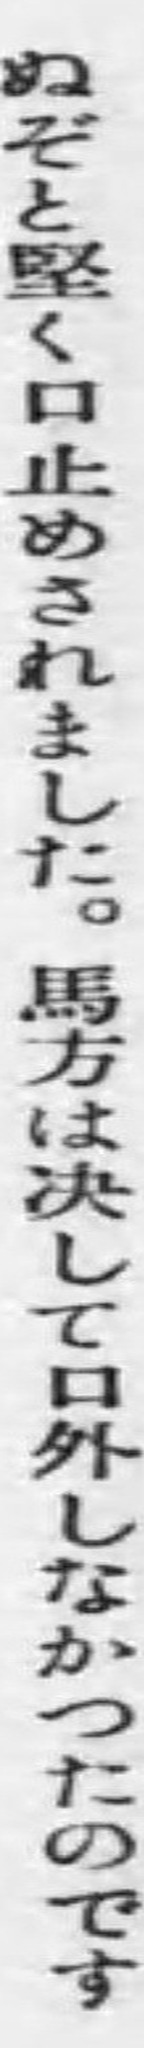ぬぞと堅く口止めされました。馬方は決して口外しなかつたのです

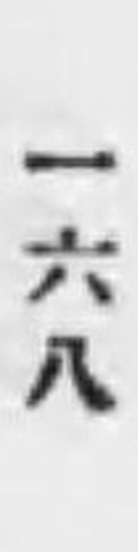一六八
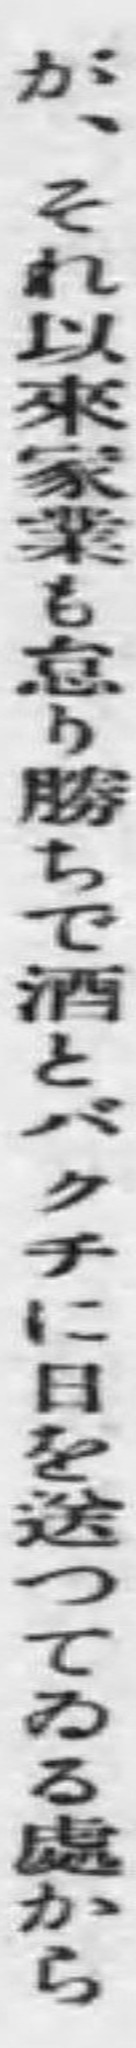が、それ以来家業も怠り勝ちで酒とバクチに日を送つてゐる処から
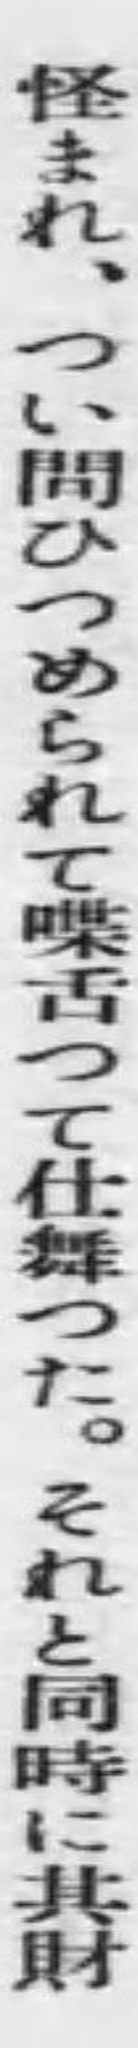怪まれ、つい問ひつめられて喋舌つて仕舞つた。それと同時に其財
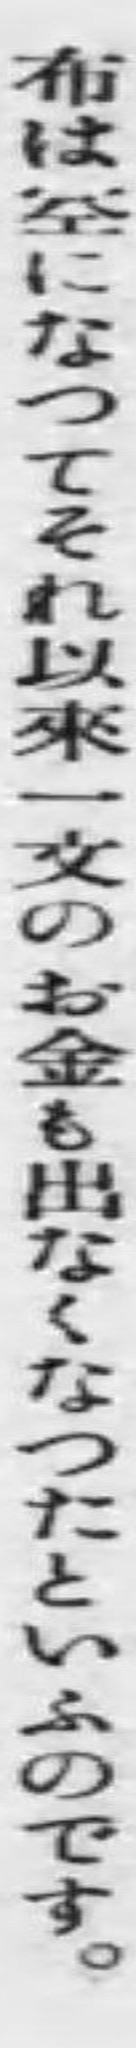布は空になつてそれ以来一文のお金も出なくなつたといふのです。
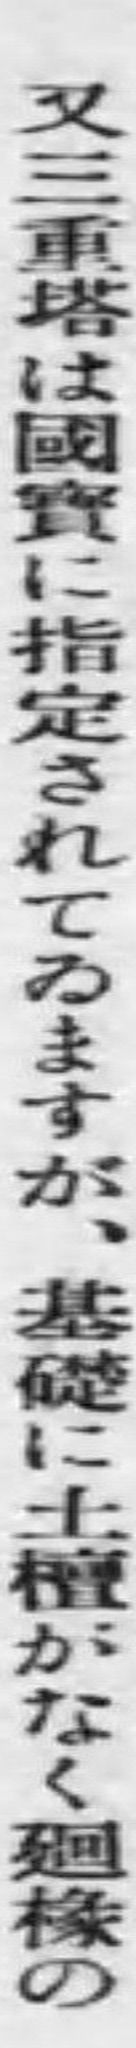又三重塔は国宝に指定されてゐますが、基礎に土檀がなく廻椽の
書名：東三河道中記 : 豊橋市及其附近案内
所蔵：国立国会図書館 National Diet Library, JAPAN
